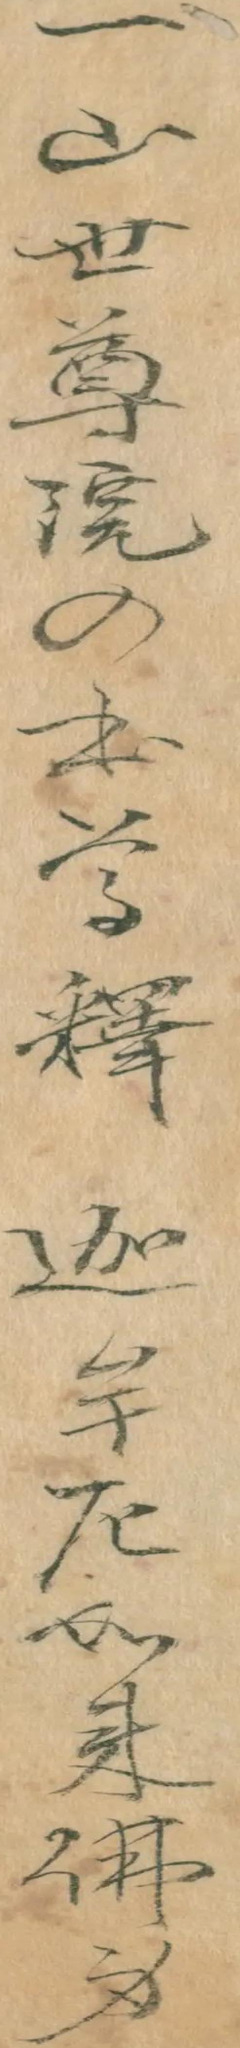一山世尊院の本尊釋迦牟尼如来佛身
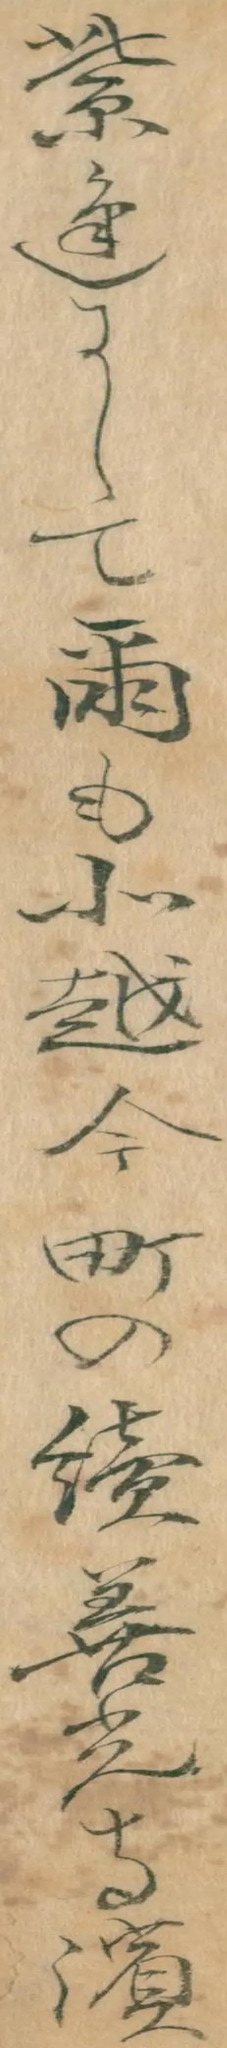紫逢にして爾も北越今町の續善光寺濱
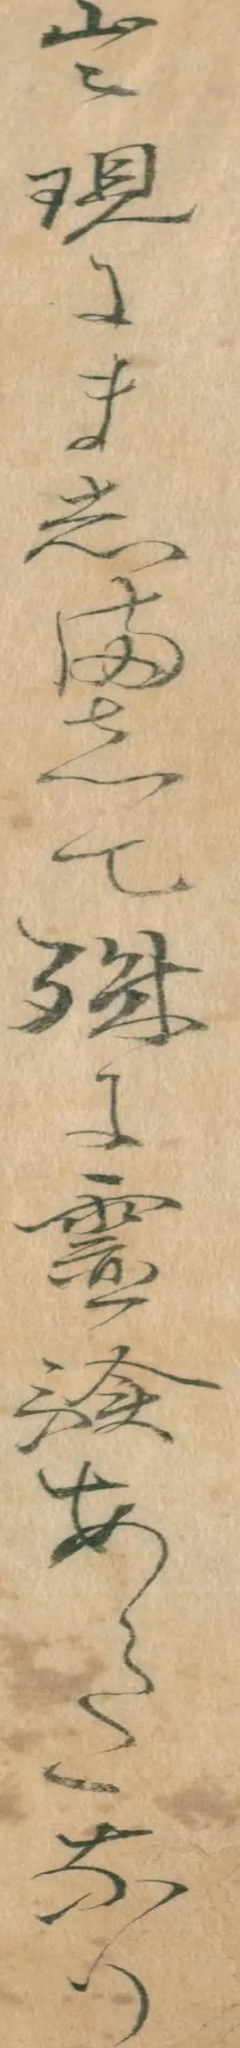出現にましまして殊に霊験あらたなり
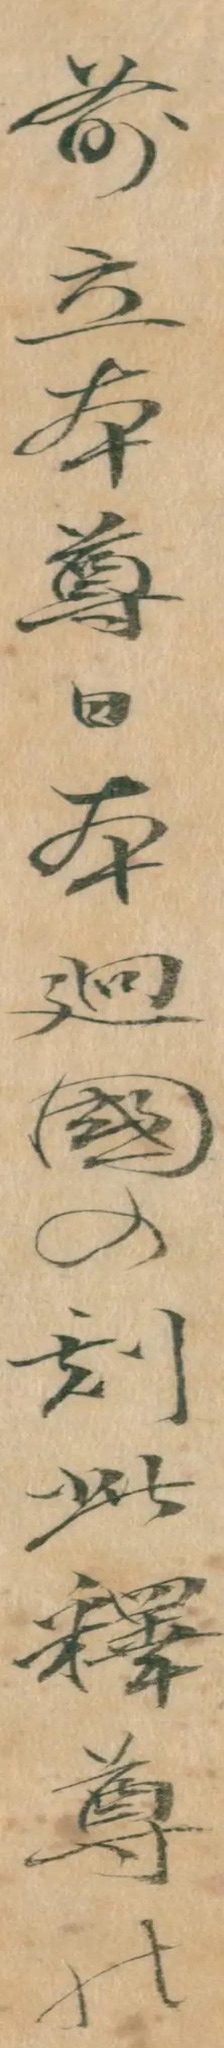前立本尊日本廻國の刻此釋尊の
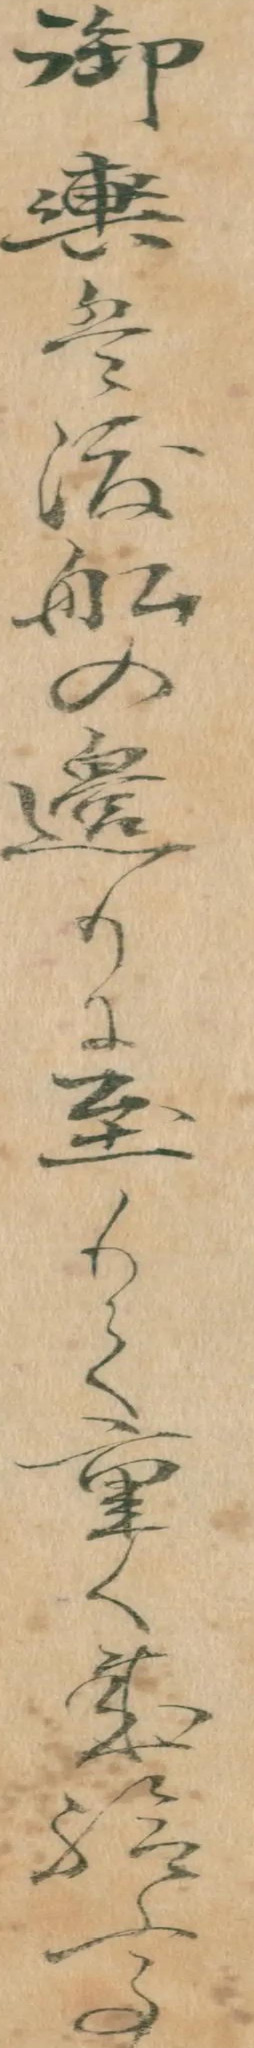御輿は渡船の邊りに至りて重く来給ふ事
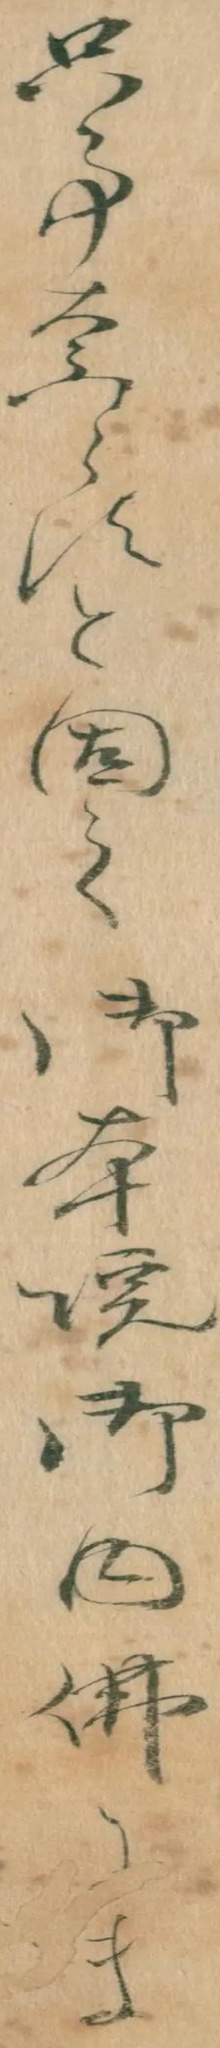只事ならすと固く御本院御内佛にま
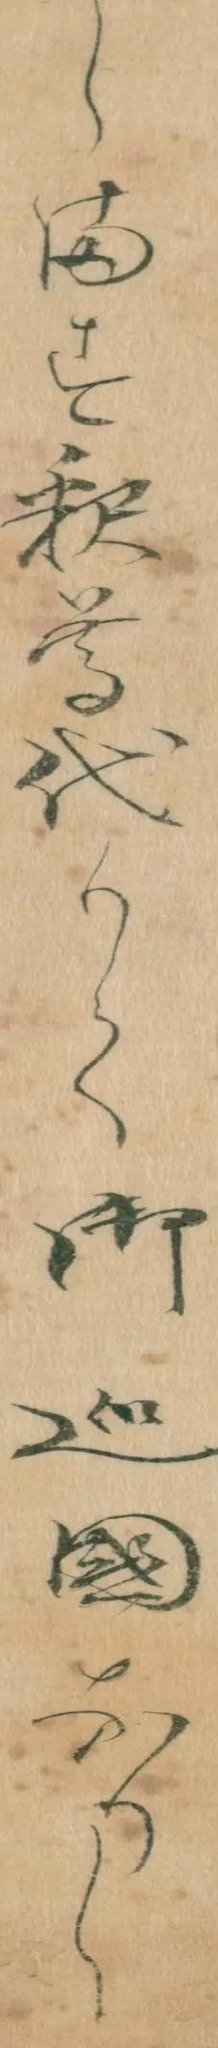します釈尊代りて御廻國なりし
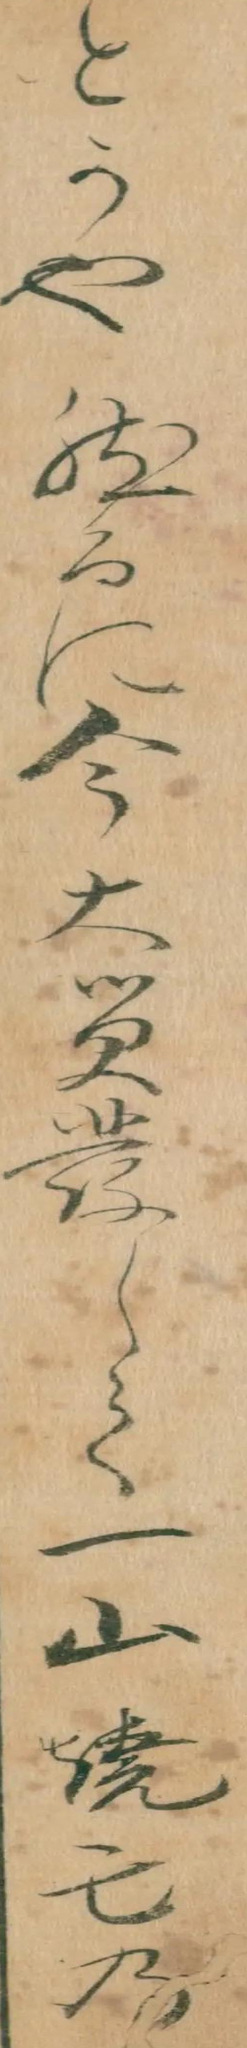とかや然るに今大災發して一山焼亡の
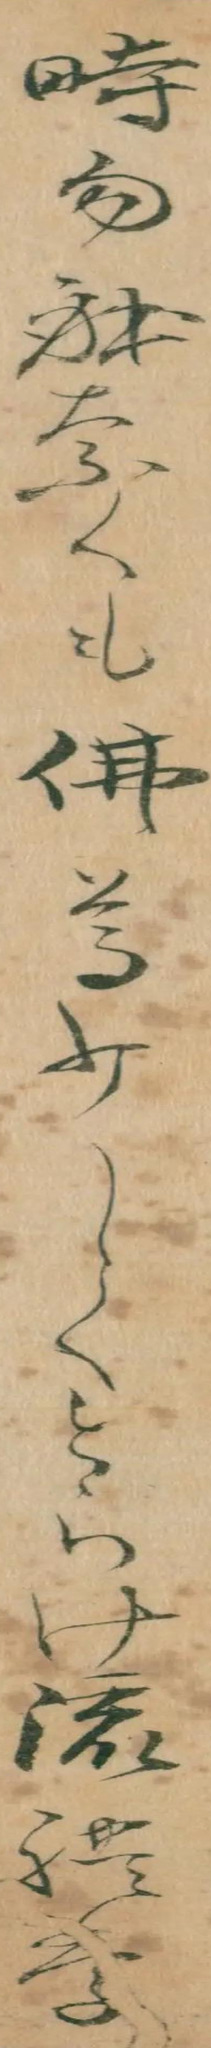時勿躰なくも佛尊少しくとらけ流れり
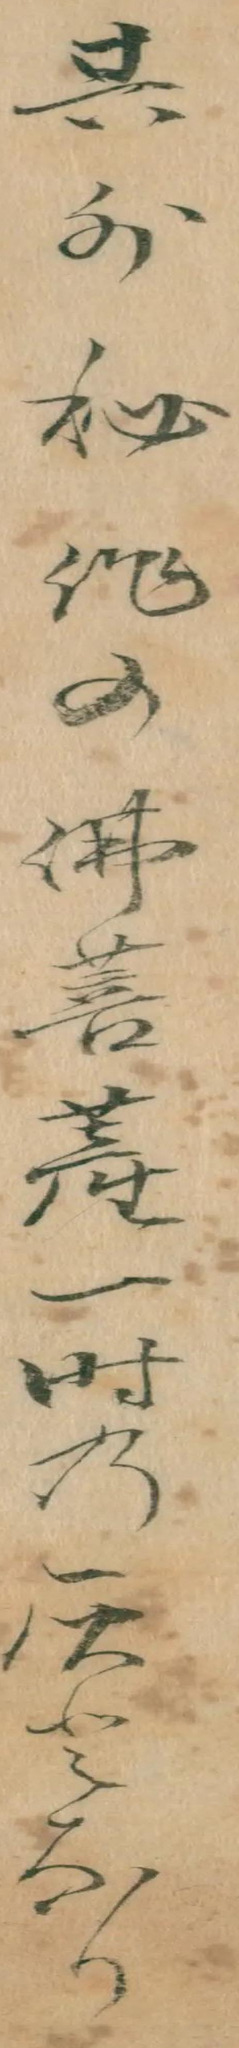其外秘作の佛菩薩一時の灰となり
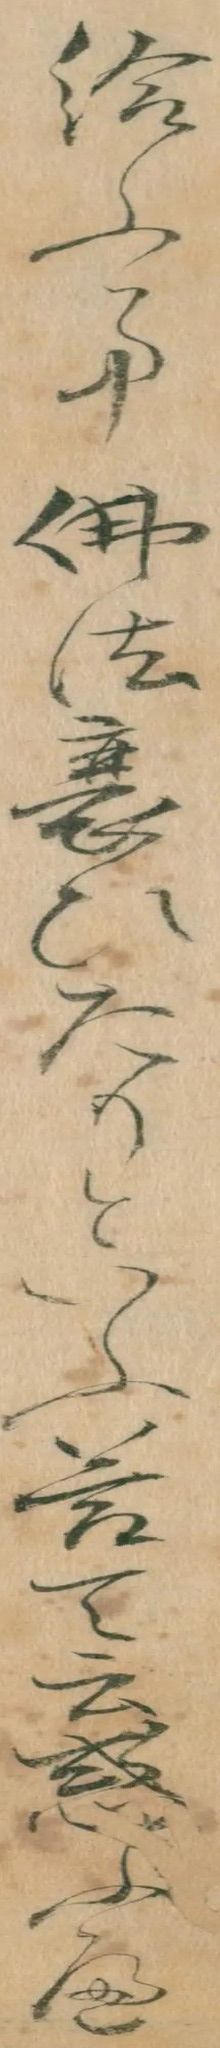給ふ事佛法襄ひたりといふ答て云惑ふへ
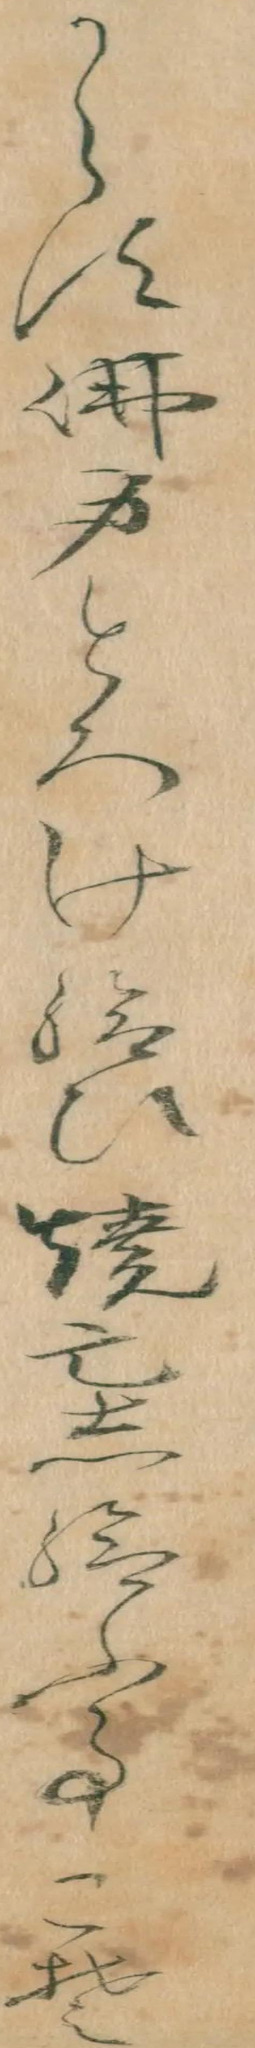からす佛力とろけ給ひ焼亡した給ふ事こそ
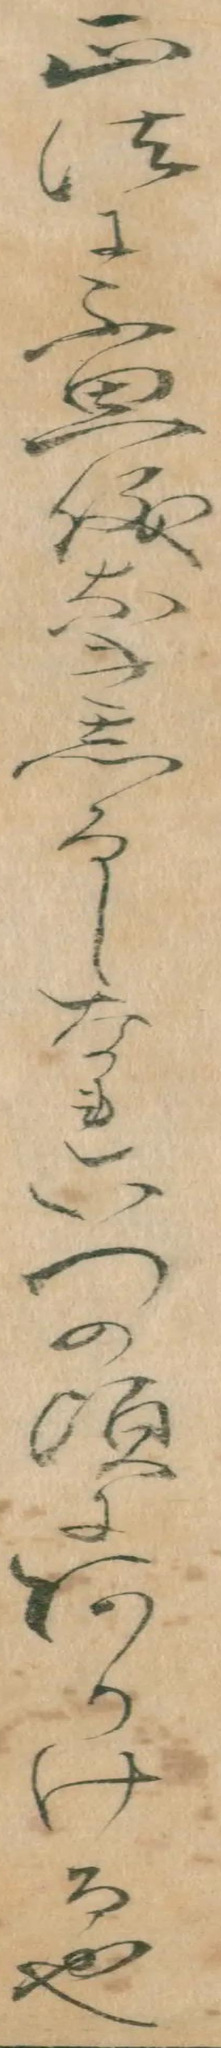正法に不思議なきしるしなれいつの頃にありけるや
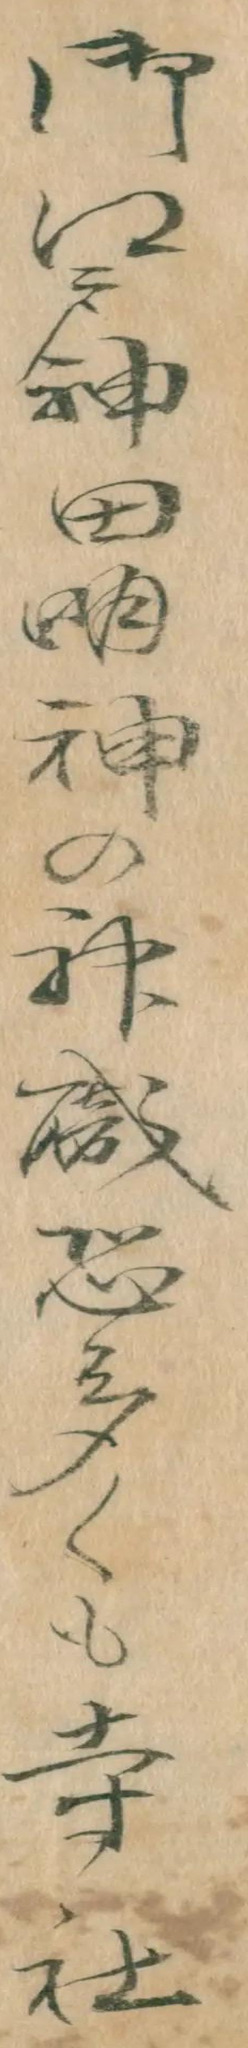御江戸神田明神の神職恐多くも寺社
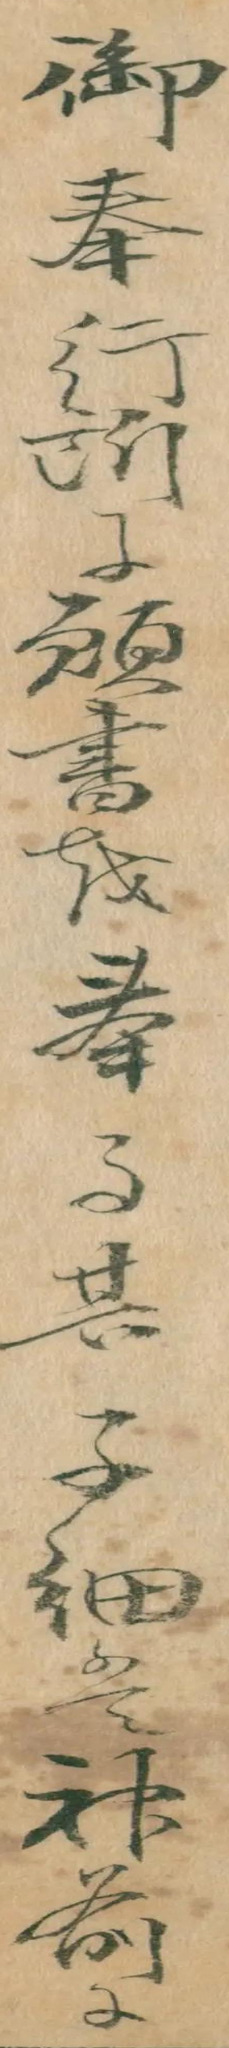御奉行所に願書を奉る其子細は神前に
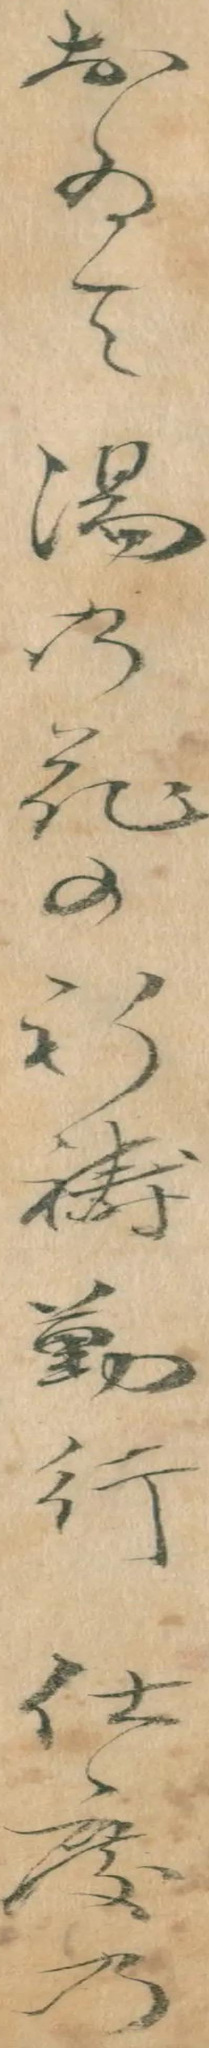おゐて湯の花の祈祷勤行仕度の
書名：俗語之種. [7]
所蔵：国立国会図書館 National Diet Library, JAPAN
